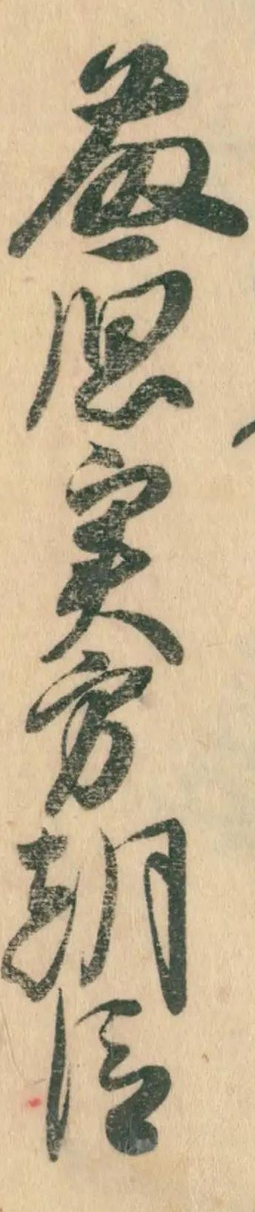藤原実方朝臣

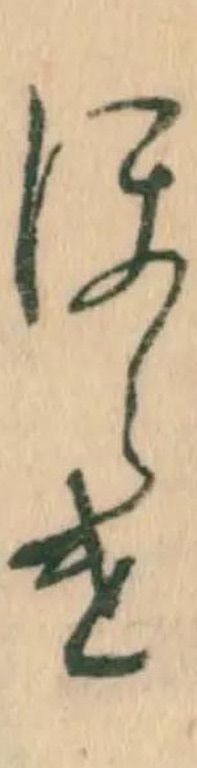ほらけ
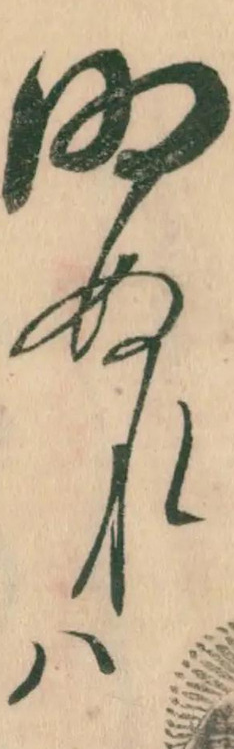明ぬれは
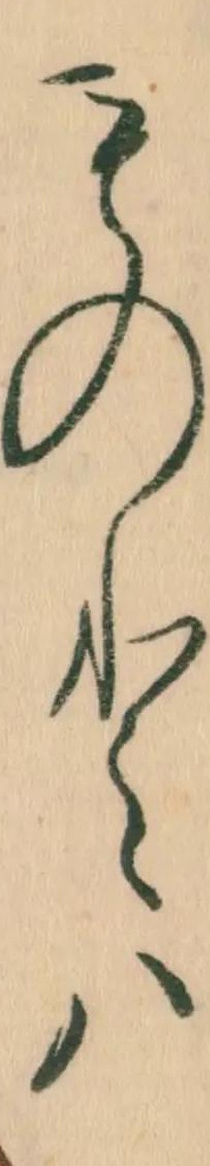ものとは
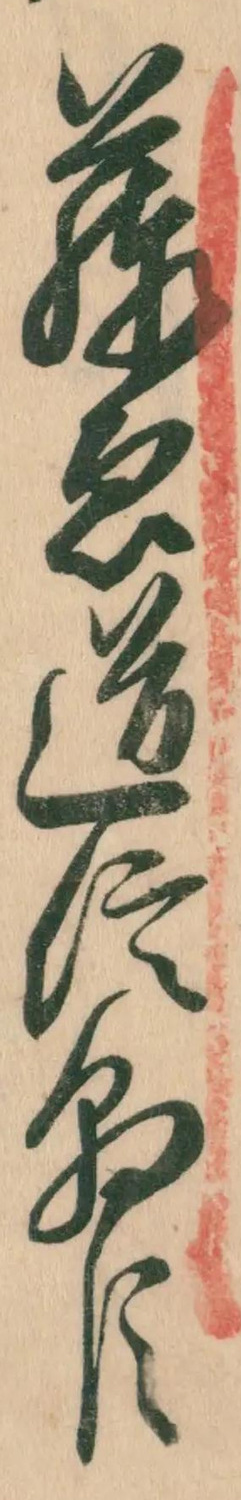き藤原道信朝臣
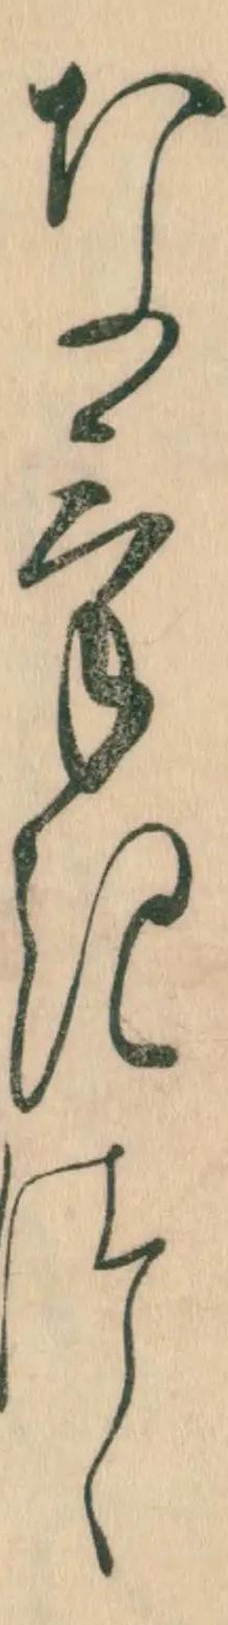なけきつゝ
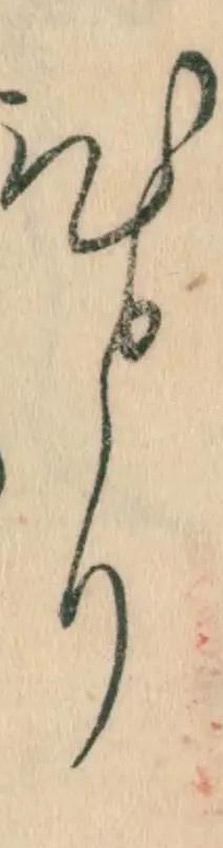ひとり
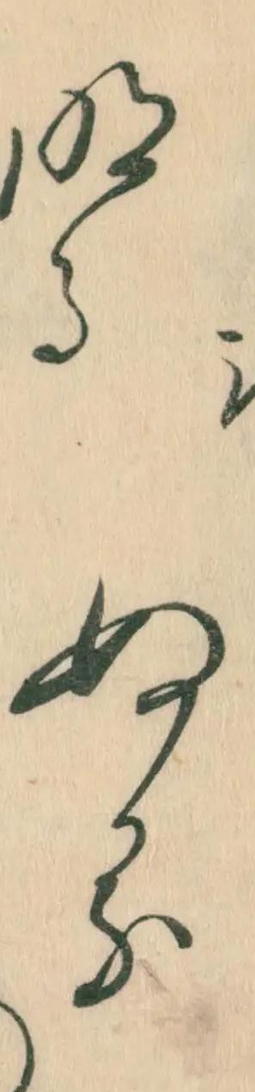明るぬる
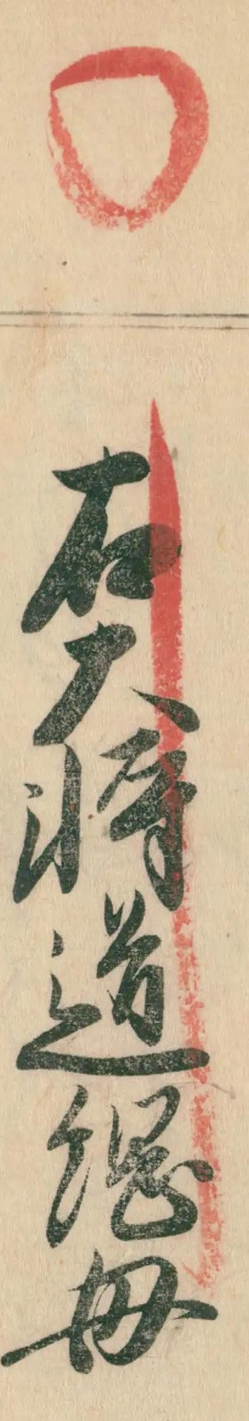右大将道綱母
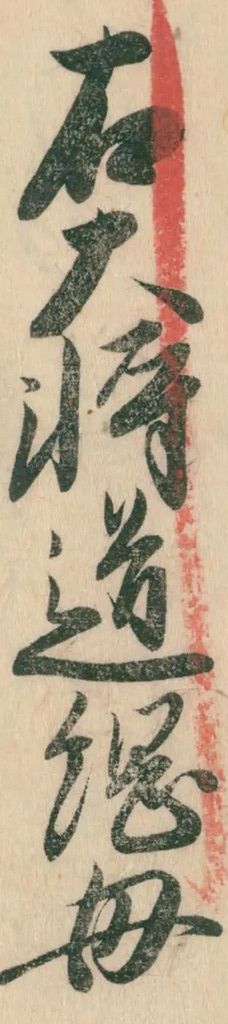右大将道綱母
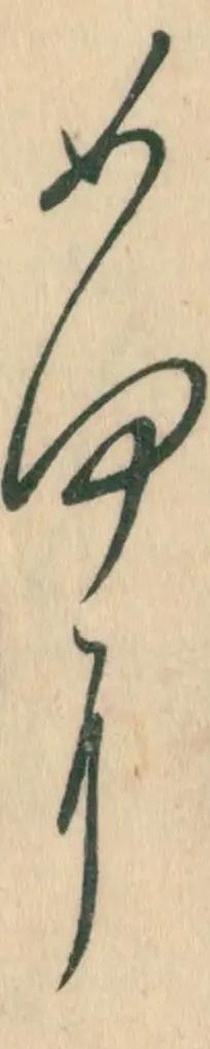如何に
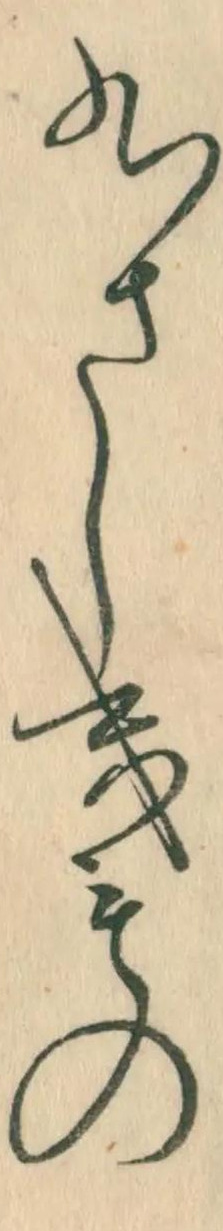ひさしきもの

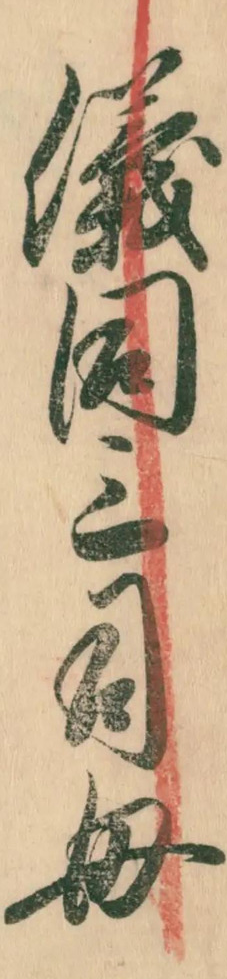儀同三司母
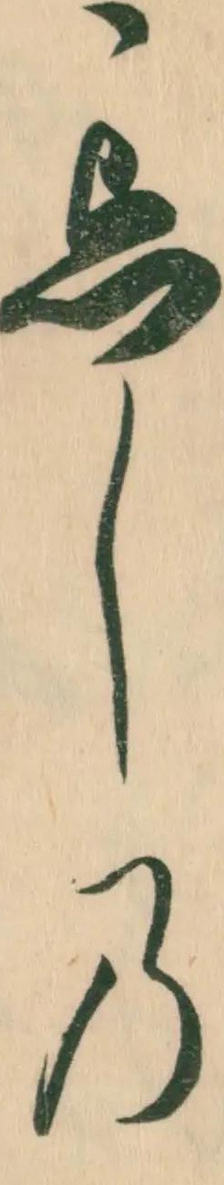忘しの
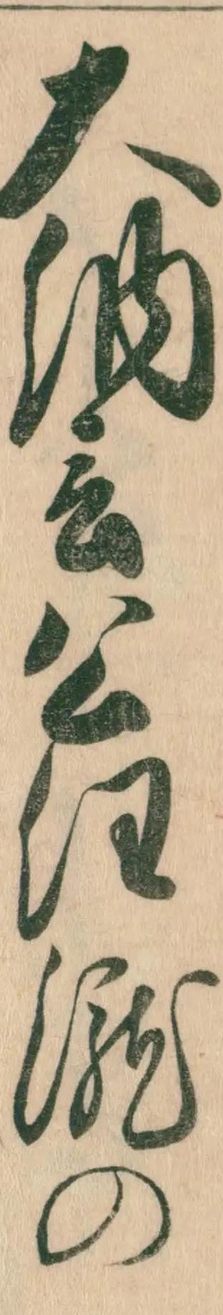大納言公任瀧の
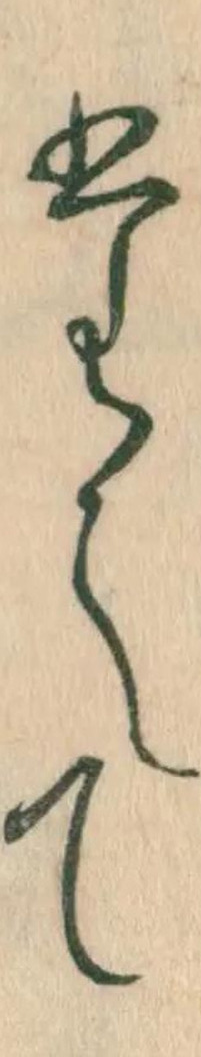たえて
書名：錦百人一首あつま織
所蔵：国立国会図書館 National Diet Library, JAPAN
